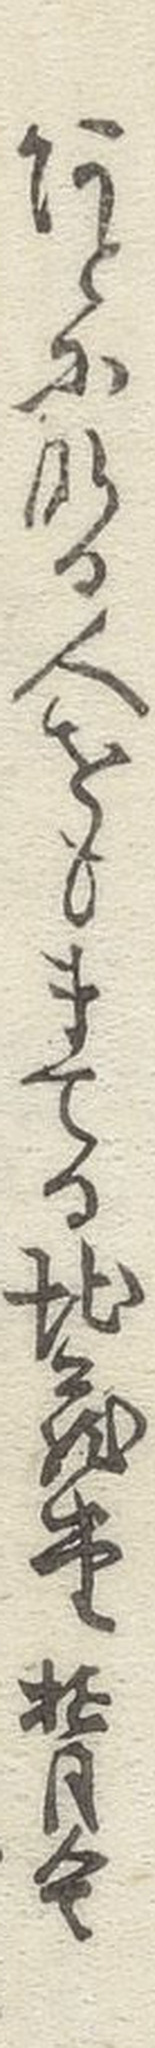あとになる人をもまてる地蔵堂遊月舎
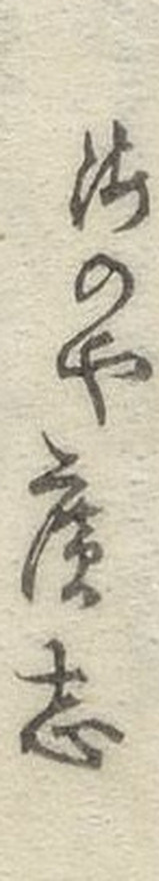海のや広志
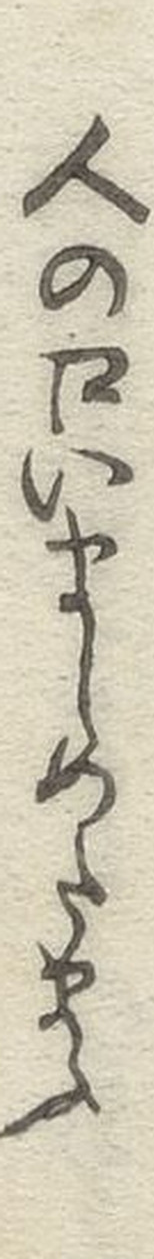人の口いましめたまふ
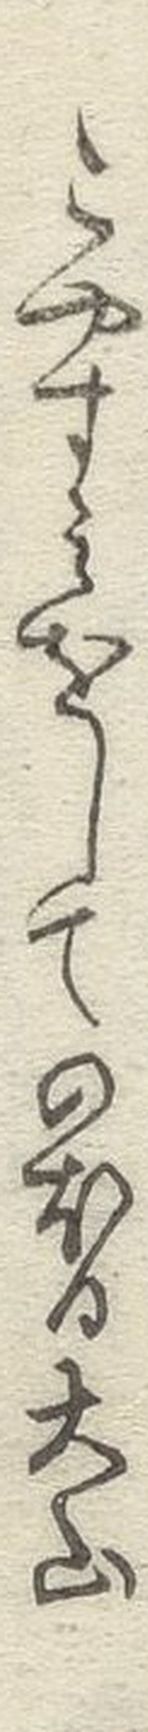こやすみをしてのほる大山岩住
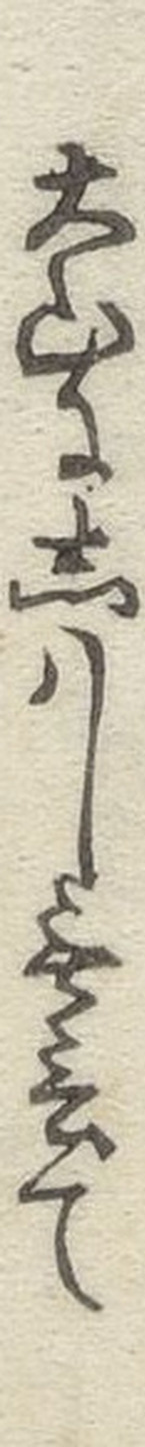大山にしはし無言て
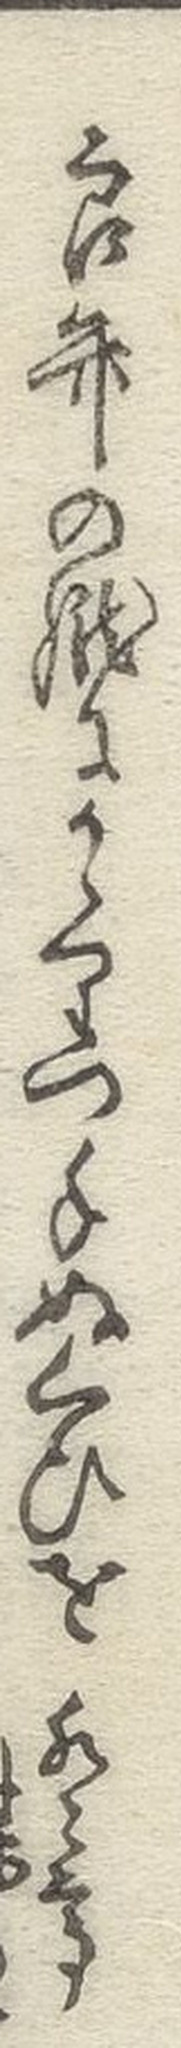良弁の瀧にかゝりつ手ぬくひを水々亭
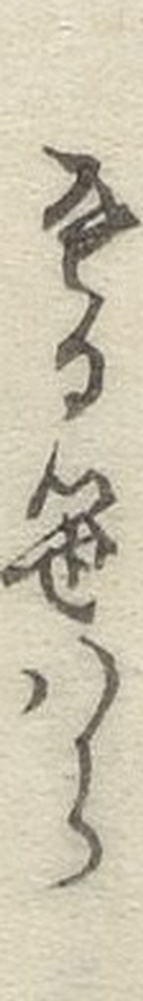通る笹はら
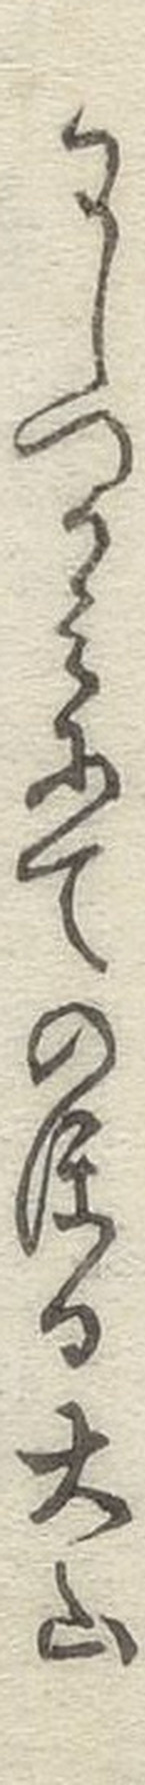わしつかみにてのほる大山岩住
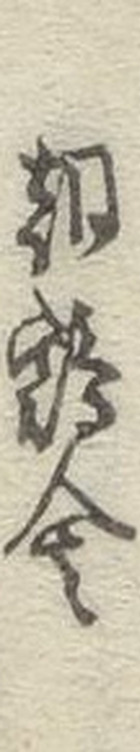朝鶏舎
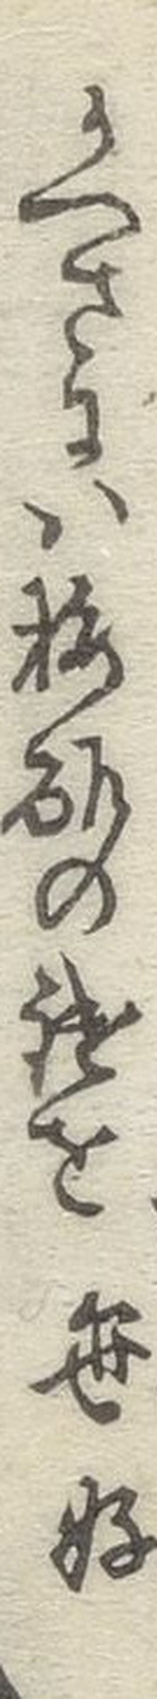かへさには梅酢の鑓を笹好
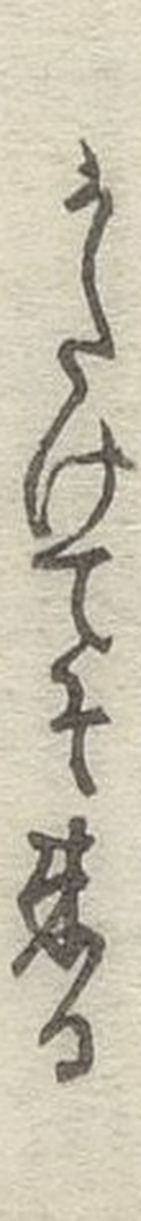かたけてそ来る
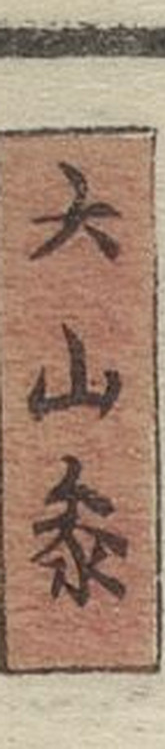大山参

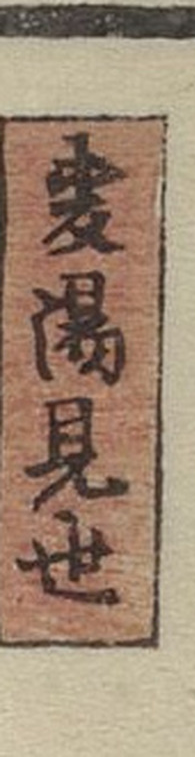麦湯見世
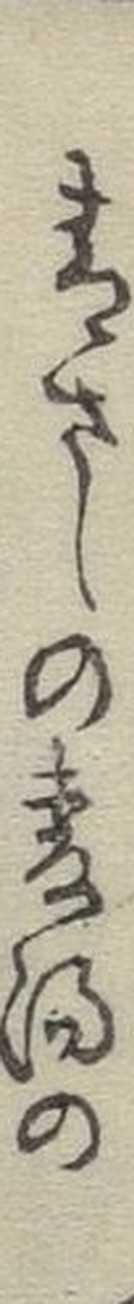青さしの麦湯の
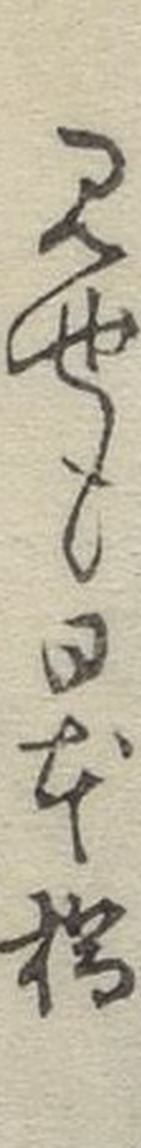見世も日本橋
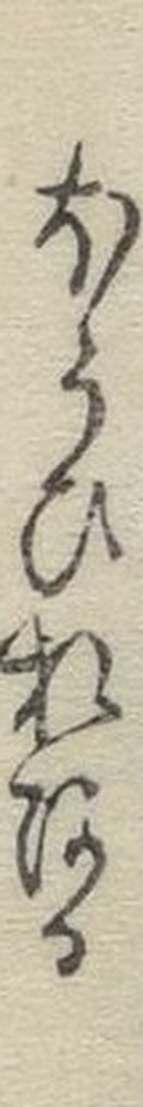ほうひ札ある
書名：Picture Album of People with Kyōka (Light Verse) (Kyōka shiki jinbutsu 狂歌四季人物)
